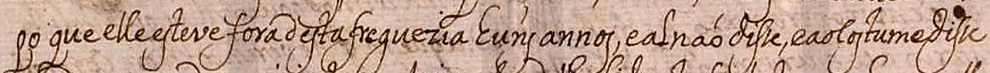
po que elle esteve fora desta freguezia huns annos, e al naõ disse, e ao costume disse
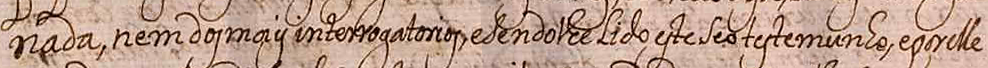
nada, nem dos mais interrogatorios, e sendolhe lido este seo testemunho, e por elle
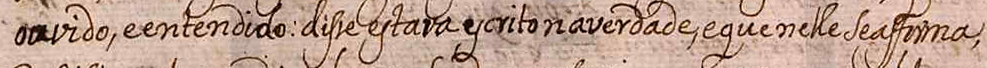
ouvido, e entendido; disse estava escrito na verdade, e que nelle se affirma,
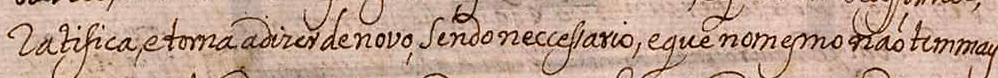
ratifica, e torna a dizer de novo, sendo neccessario, e que no mesmo naõ tem mais
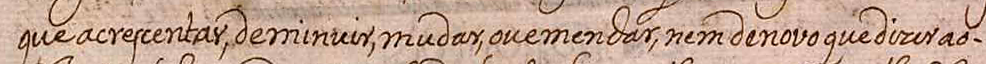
que acrescentar, deminuir, mudar, ou emendar, nem de novo que dizer ao
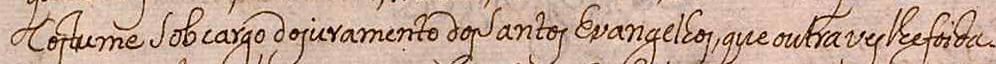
Costume Sob cargo do juramento dos Santos Evangelhos, que outra ves lhe foi da
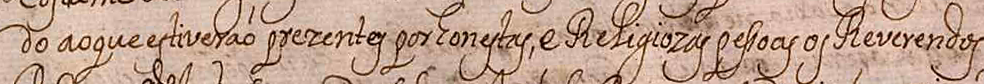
do ao que estiveraõ prezentes por honestas, e Religiozas pessoas os Reverendos
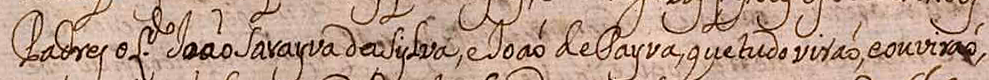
Padres o L.do Ioaõ Sarayva da Sylva, e Ioaõ de Payva, que tudo viraõ, e ouviraõ,
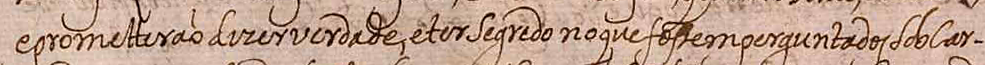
e prometteraõ dizer verdade, e ter Segredo no que fossem perguntados Sob Car
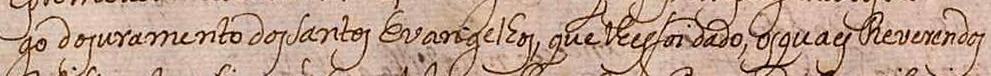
go do juramento dos Santos Evangelhos, que lhes foi dado, os quaes Reverendos
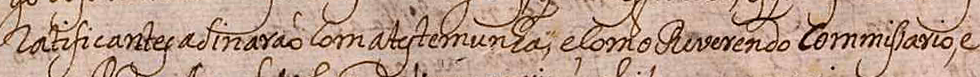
ratificantes asinaraõ com a testemunha, e com o Reverendo Commissario, e
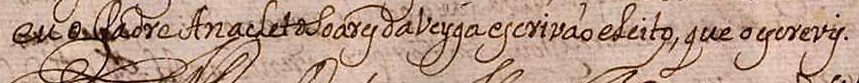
eu o Padre Anacleto Soares da Veyga escrivaõ eleito, que o escrevy.
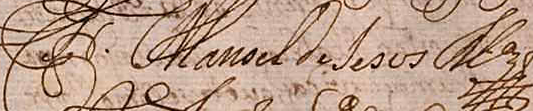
Fr. Manoel de Iesus Ma
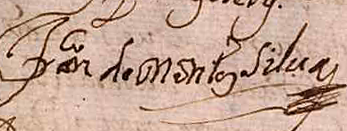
Franco de Montes Silua
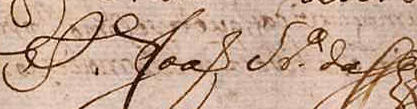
P.e Joaõ Sr.a da s
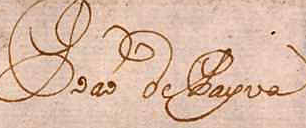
Ioaõ de Payva
